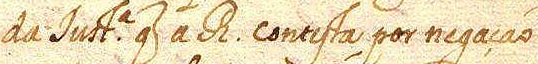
da Iust.a q̄ a R. contesta, por negaçaõ
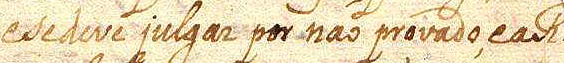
e se deve julgar por naõ provado, e a R.
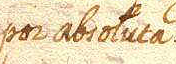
por absoluta
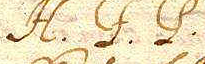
H. F. P.
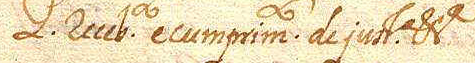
P. Receb.to e cumprim.to de just.a &a
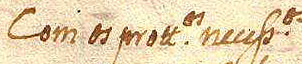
Com os prott.os necess.os
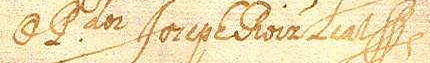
o P.dor Jozeph Roiz̄ Leal
